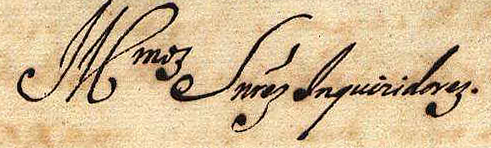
Il.moz Snr̄ez Inquizidorez.
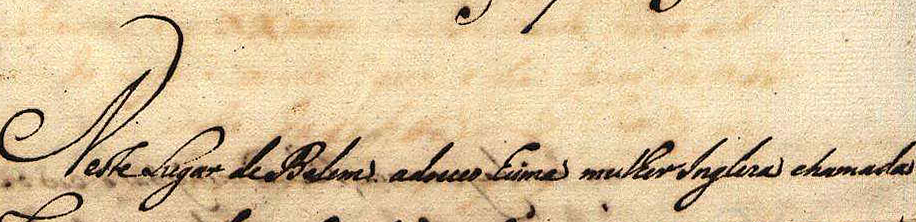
Neste Lugar de Belem adoeceo huma mulher Ingleza chamada
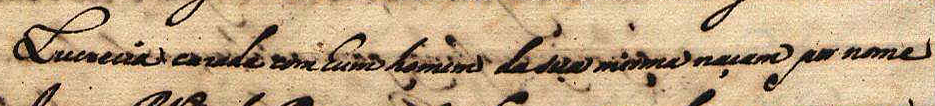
Lucrecia cazada com hum homem da sua mesma naçam por nome
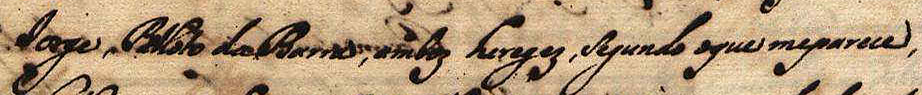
Iorge, Pilloto da Barra, amboz heregez, segundo o que me parece,
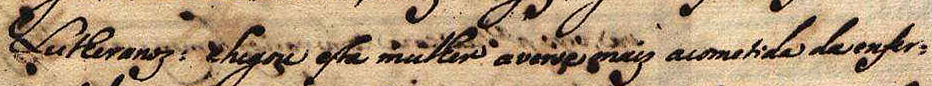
Lutheranos: chegou esta mulher a verse maiz acometida da enfer
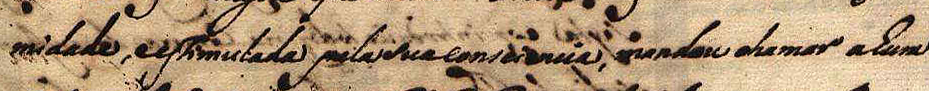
midade, e estimulada pela sua consciencia, mandou chamar a hum
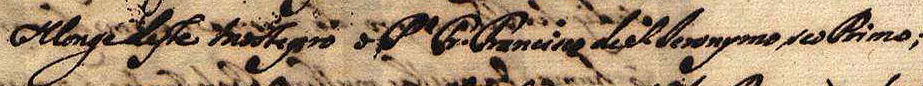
Monge deste mosteyro o P.e F. Francisco de S Ieronymo seo Primo;
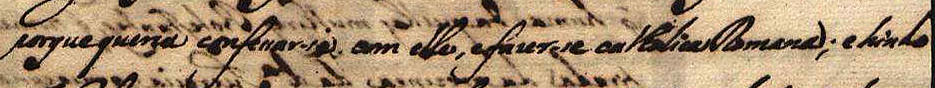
porque queria confessar-se com elle, e fazer-se catholica Romana; e hindo
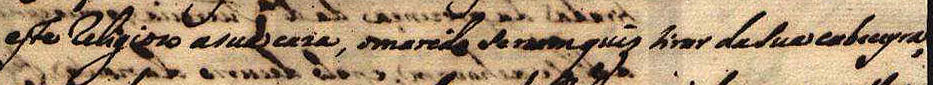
este Religiozo a sua caza, o marido se nam quiz tirar da sua cabeceyra,
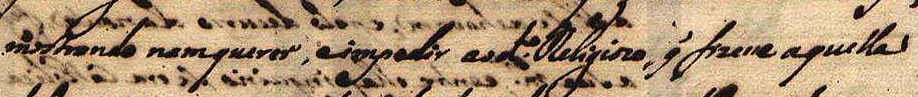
mostrando nam querer, e impedir ao d.o Religiozo, q̄ fizese aquella
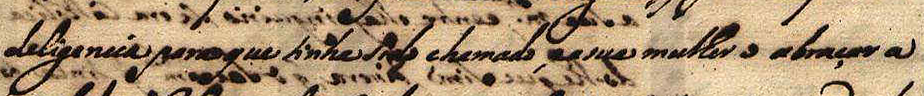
deligencia para que tinha sido chamado, e a sua mulher o abraçar a
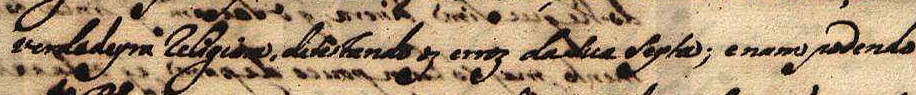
verdadeyra Religiam, detestando oz erroz da sua seyta; e nam podendo
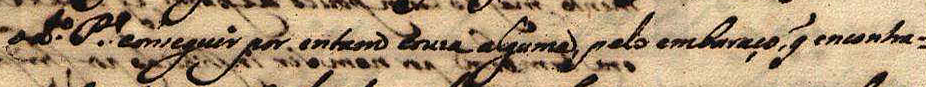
o d̄.o P.e conseguir por entam couza alguma, pelo embaraço, q̄ encontra
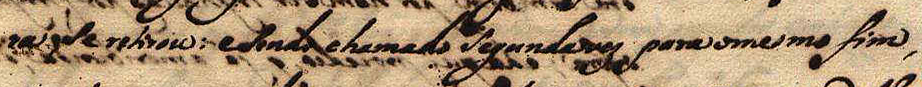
ra se retirou: e sendo chamado segunda vez para o mesmo fim,
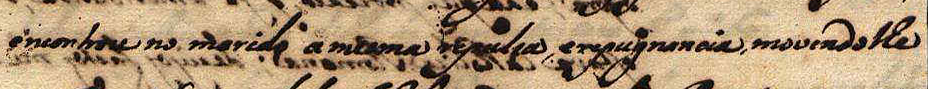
encontrou no marido a mesma repulsa, e repugnancia, movendolhe
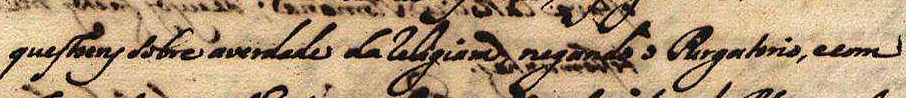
questoens sobre a verdade da Religiam negando o Purgatorio, e em
